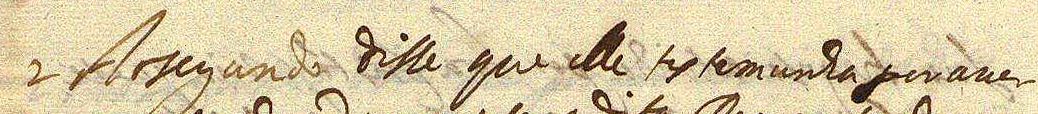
item Ao segundo disse que elle testemunha per auer
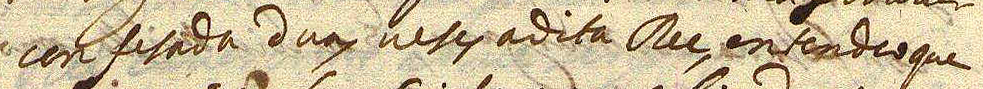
confesada duas ueses a dita Ree, entendeo que
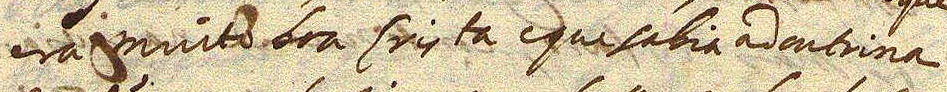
era muito boa Crista e que sabia a doutrina
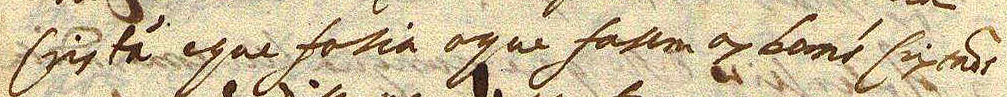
Cristã e que fasia o que fasem os bons̄ Cristaõs
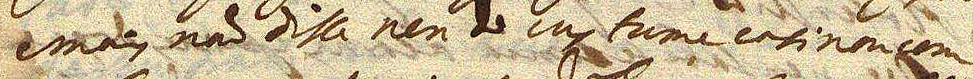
e mais naõ disse nen do custume e asinou com
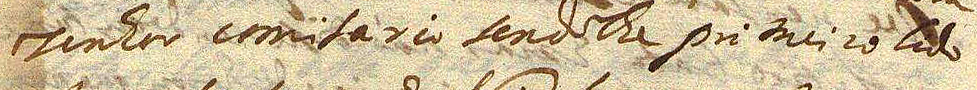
o senhor comisario sendolhe primeiro lido
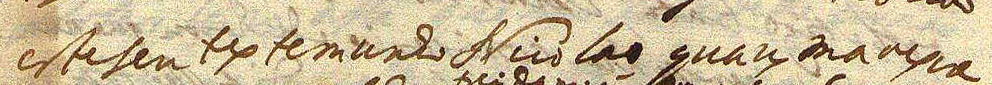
este seu testemunho Nicolao quaresma o escre
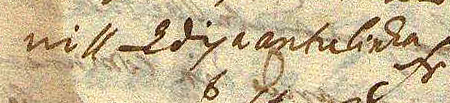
ui // E dis a antrelinha
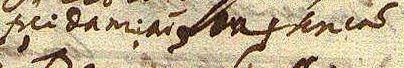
frei damiaõ dassençaõ
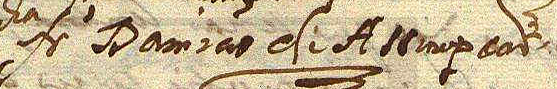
fr Damiaõ de Assumpçaõ
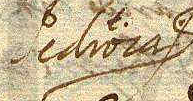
Pedroza
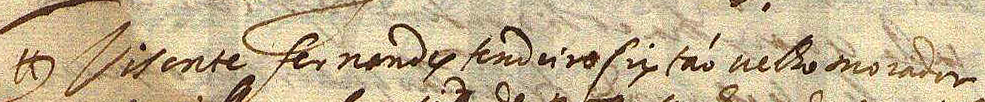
item Visente fernandes tendeiro Cristaõ uelho morador
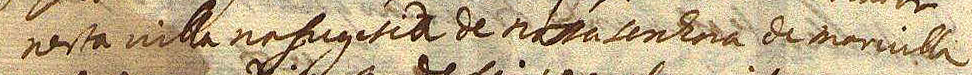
nesta uilla na fregesia de nossa senhora de maruilla
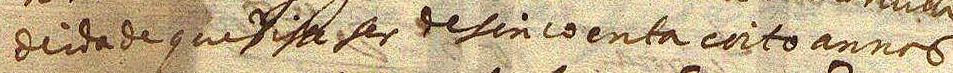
de idade que disse ser de sincoenta e oito annos
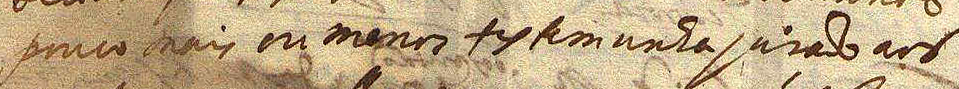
pouco mais ou menos testemunha jurado aos
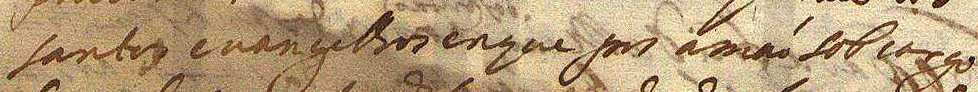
santos euangelhos en que pos a maõ sob cargo
